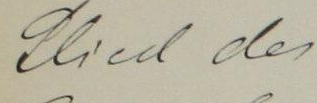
Glied des
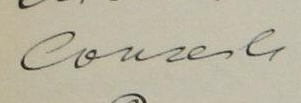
Conseils
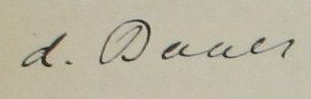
d. Bauer
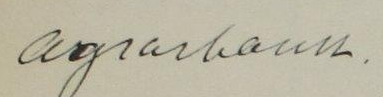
Agrarbank
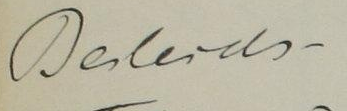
Beileids-
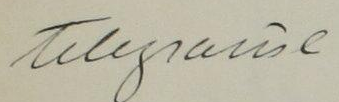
telegramme
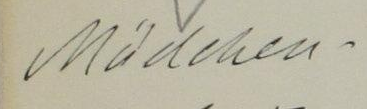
Mädchen-
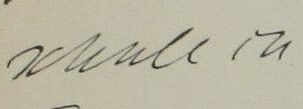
schule in
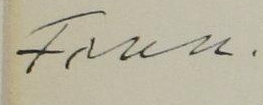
Finn
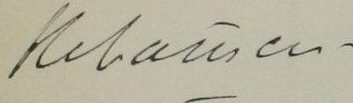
Hebammen
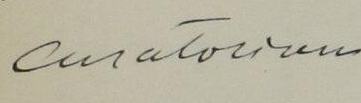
curatorium
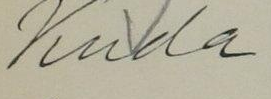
Kuda
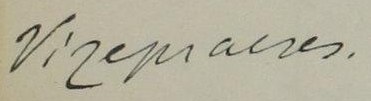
Vizepraeses.
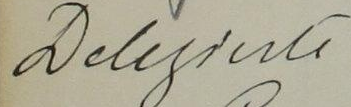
Delegierte
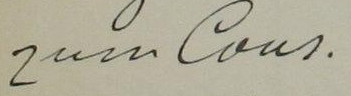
zum Cons.
